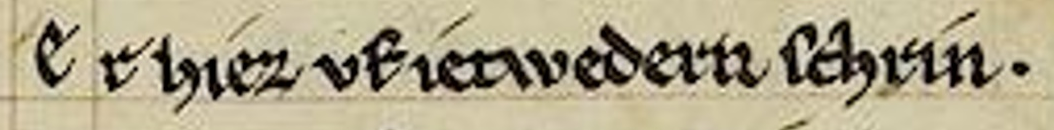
Er hiez vf ietwedern ſchrin.
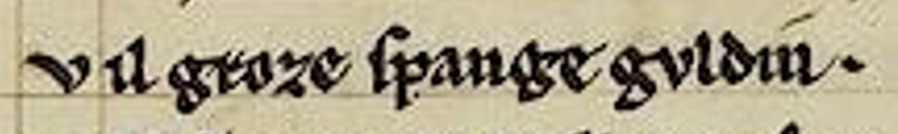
Vil groze ſpange gvldin.
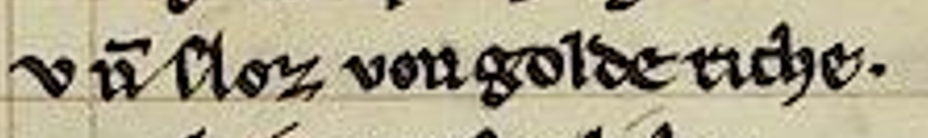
Vn(d) ſloz von golde riche.
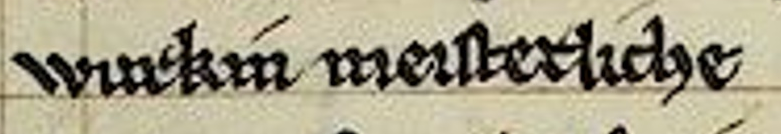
Wurkin meiſterlilche
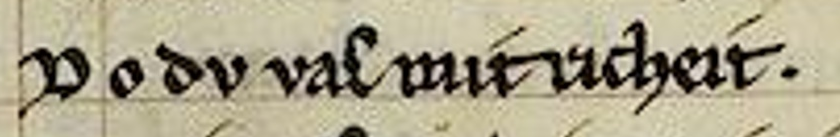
Do dv vaſ mit richeit.
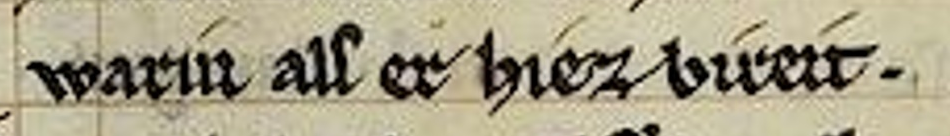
Warin alſ er hiez bireit.
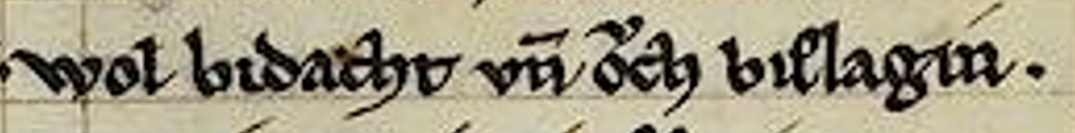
Wol bidacht vn(d) o°vch biſlagin.
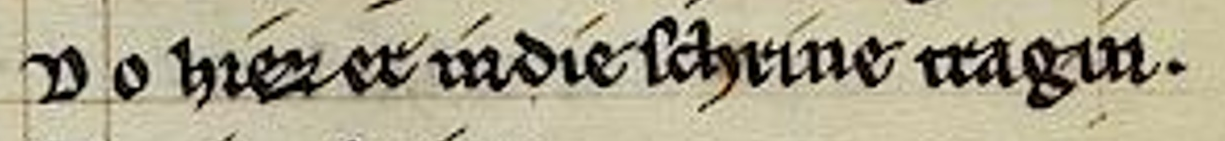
Do hiez er in die ſchrine tragin.
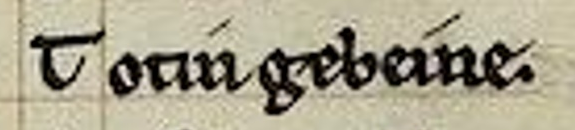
Totin gebeine.
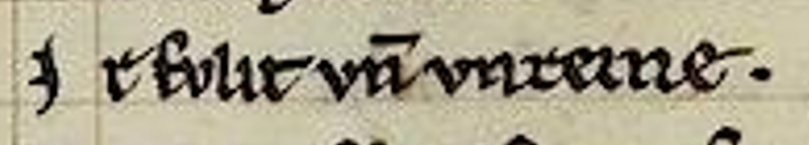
Ir fulit vn(d) vnreine.
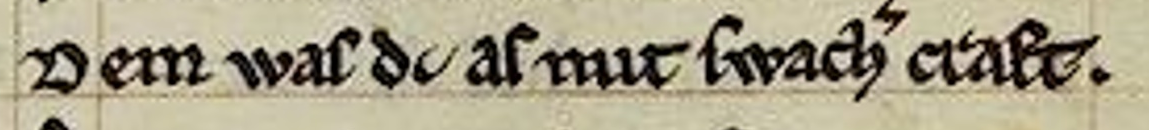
Dem waſ d(az) aſ mit ſwach(er) craft.
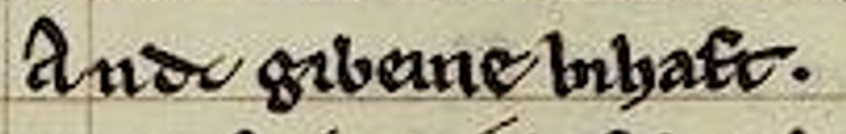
An d(az) gibeine bihaft.
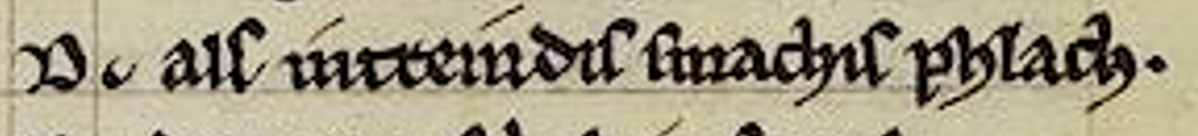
D(az) alſ intreindiſ ſmachiſ phlach.
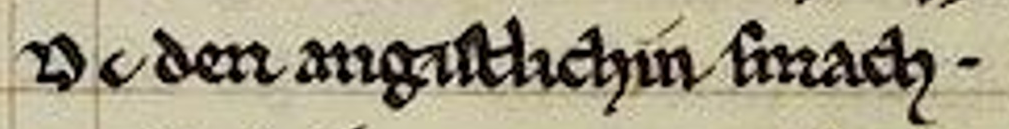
D(az) den angiſtlichin ſmach.
